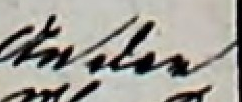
An der
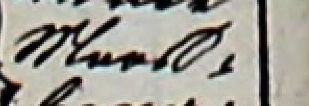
Mars„
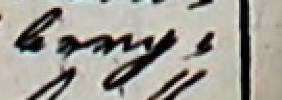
berg„
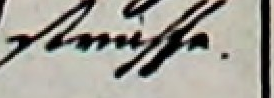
straffe.
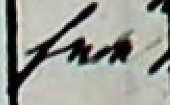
see
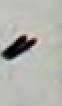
„
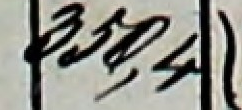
350,4
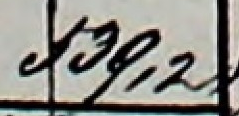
539,2
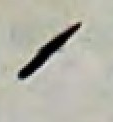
1
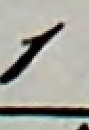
1
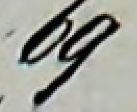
69
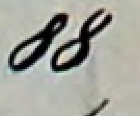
88
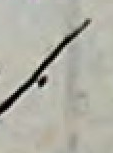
./.
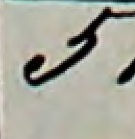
5
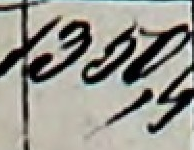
1350,4
